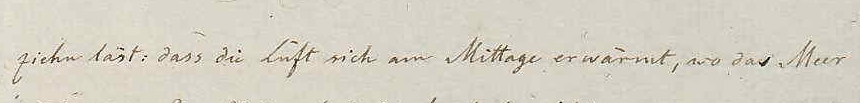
ziehn läst: dass die Luft sich am Mittage erwärmt, wo das Meer
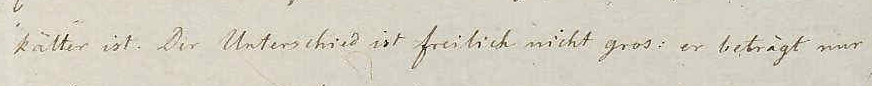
kälter ist. Der Unterschied ist freilich nicht gros: er beträgt nur
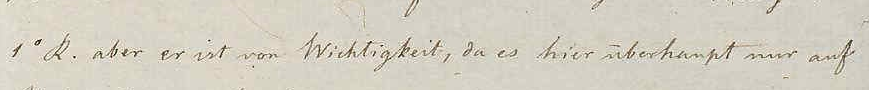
1° R. aber er ist von Wichtigkeit, da es hier überhaupt nur auf
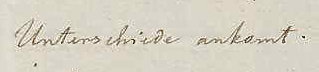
Unterschiede ankomt.
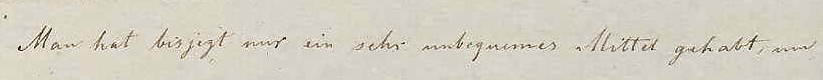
Man hat bis jezt nur ein sehr unbequemes Mittel gehabt, um
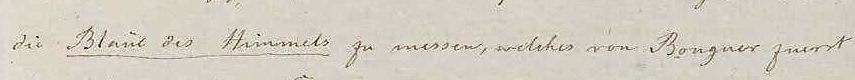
die Bläue des Himmels zu messen, welches von Bouguer zuerst
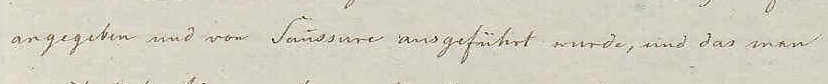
angegeben und von Saussure ausgeführt wurde, und das man
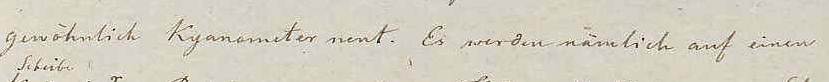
gewöhnlich Kyanometer nent. Er werden nämlich auf einen
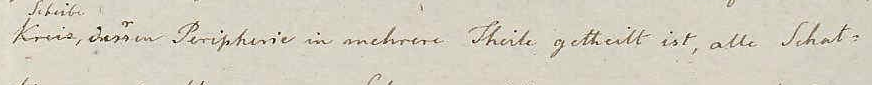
KreisScheibe, dessren Peripherie in mehrere Theile getheilt ist, alle Schat-
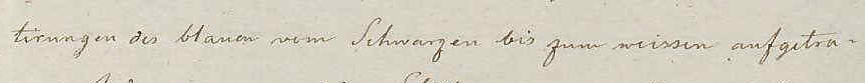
tirungen des blauen vom Schwarzen bis zum weissen aufgetra-
